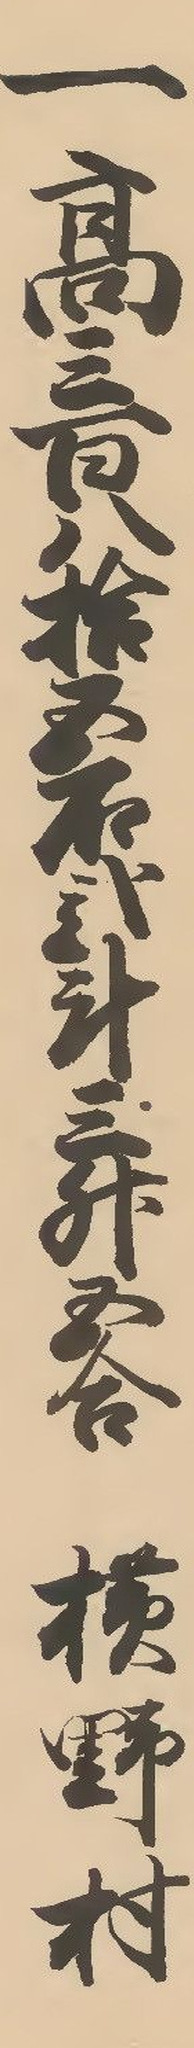一髙三百八拾五石弐斗三升五合横野村
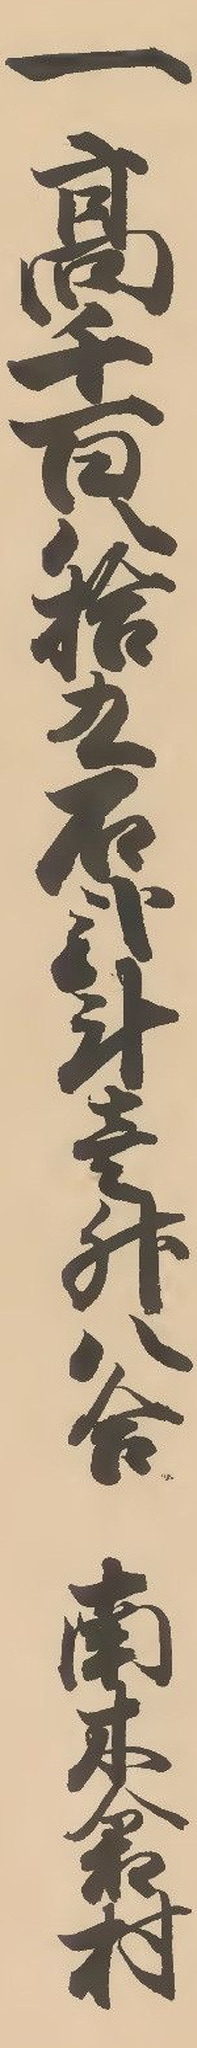一髙千百八拾九石弐斗壱升八合南木倉村
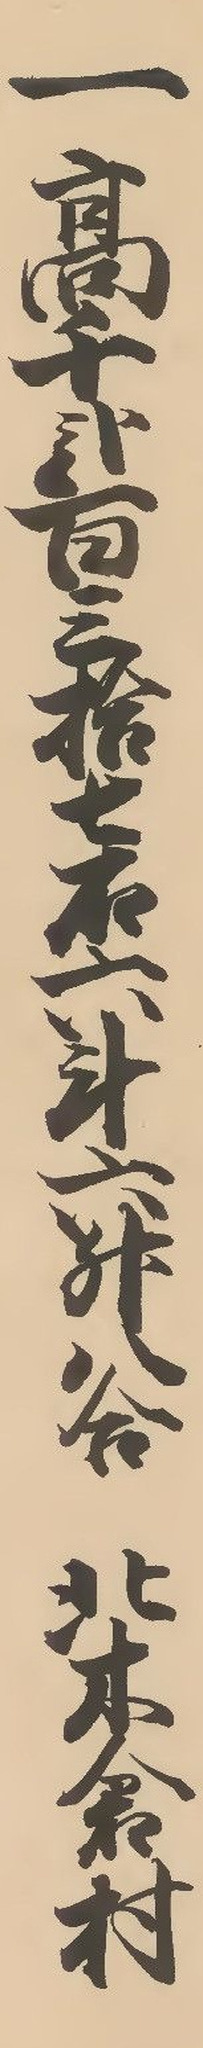一髙千弐百三拾七石六斗六升八合北木倉村
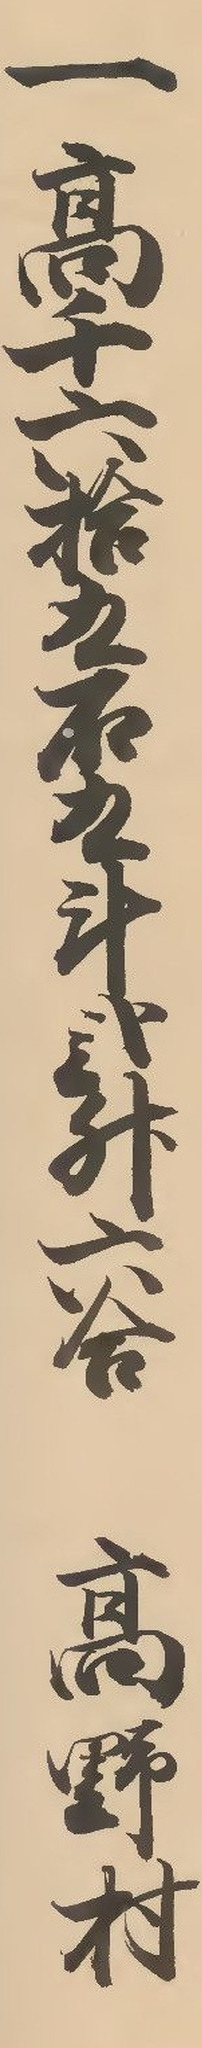一髙千六拾九石九斗弐升六合髙野村
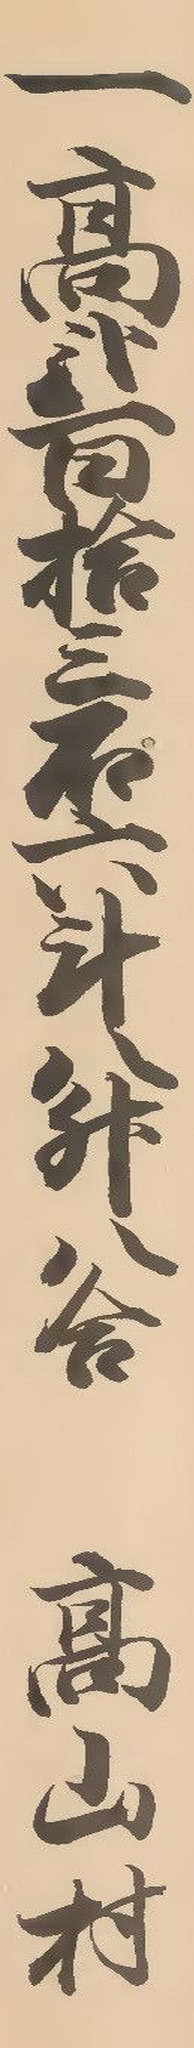一髙弐百拾三石六斗八升八合髙山村
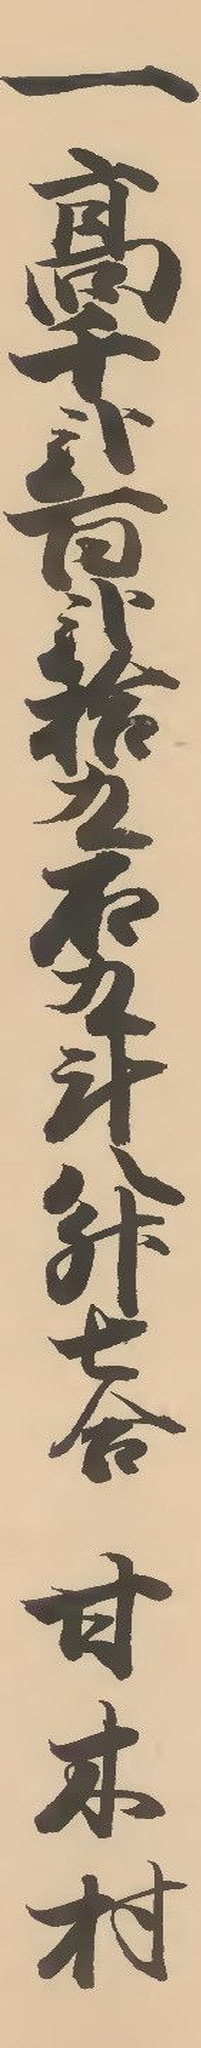一髙千弐百弐拾九石九斗八升七合甘木村
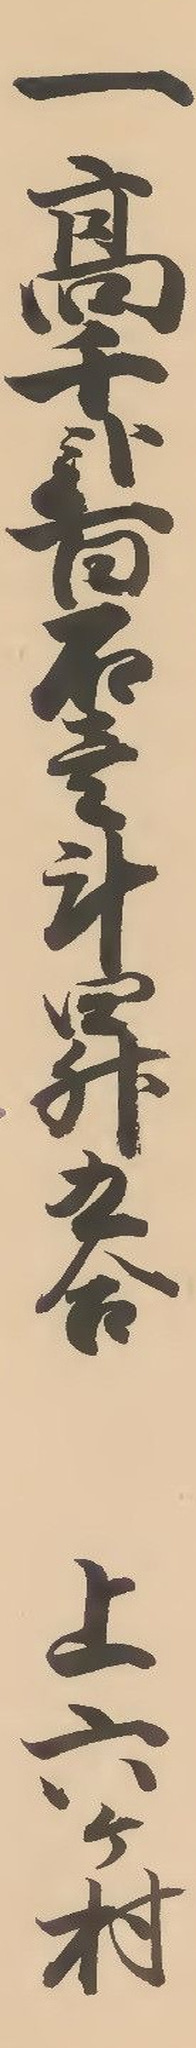一髙千弐百石壱斗四升九合上六ケ村
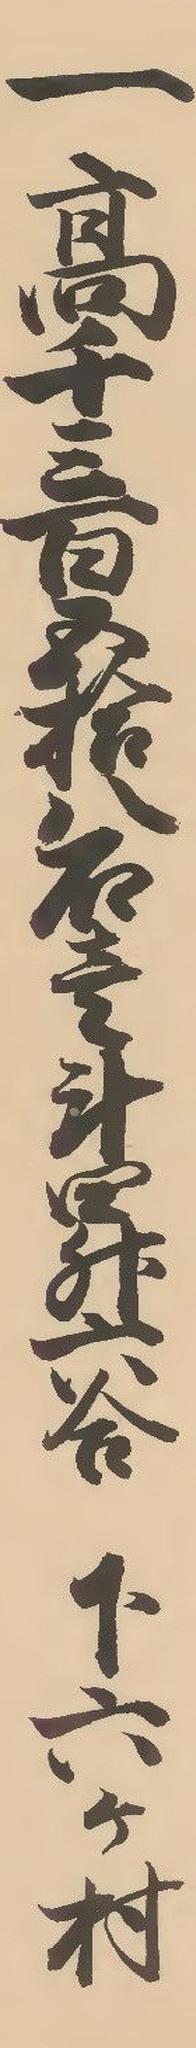一髙千三百五拾八石壱斗四升六合下六ケ村

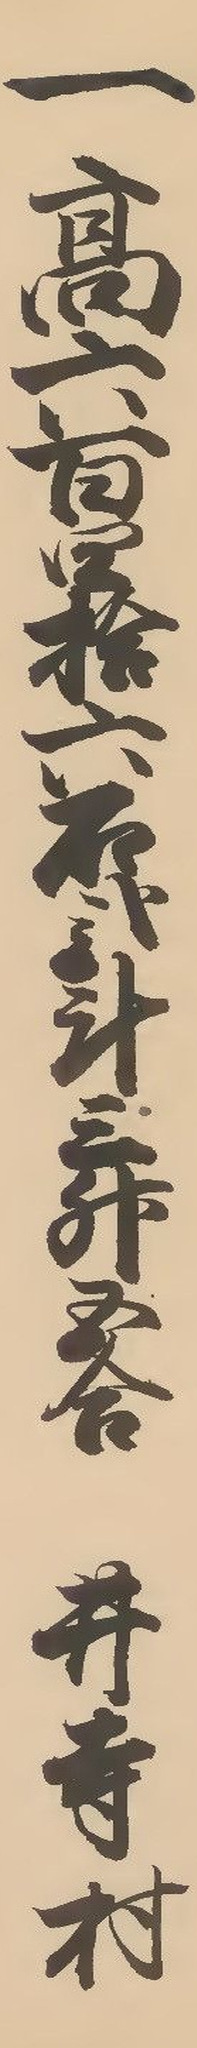一髙六百四拾六石弐斗三升五合井手村
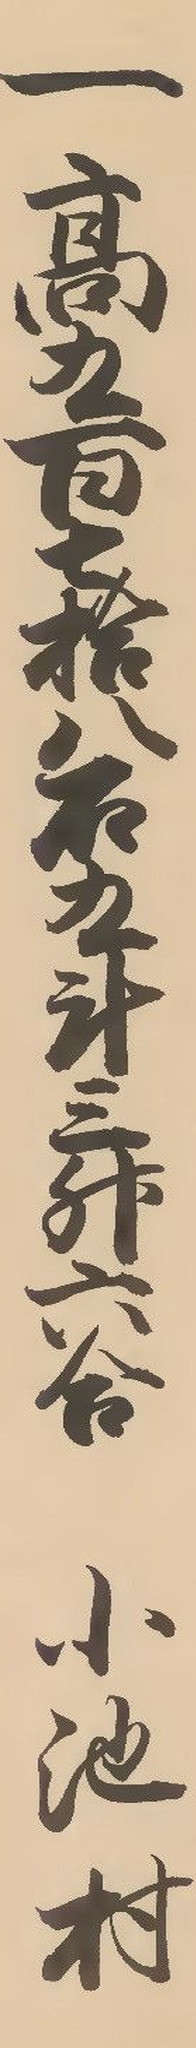一髙九百七拾八石九斗三升六合小池村
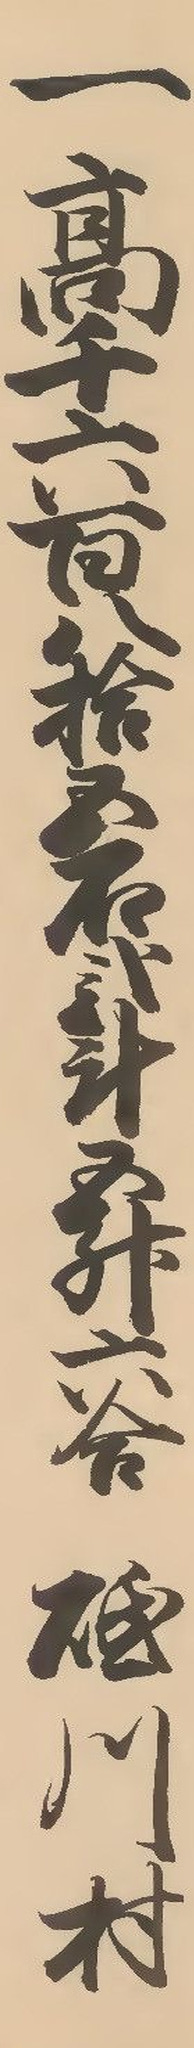一髙千六百八拾五石弐斗五升六合砥川村
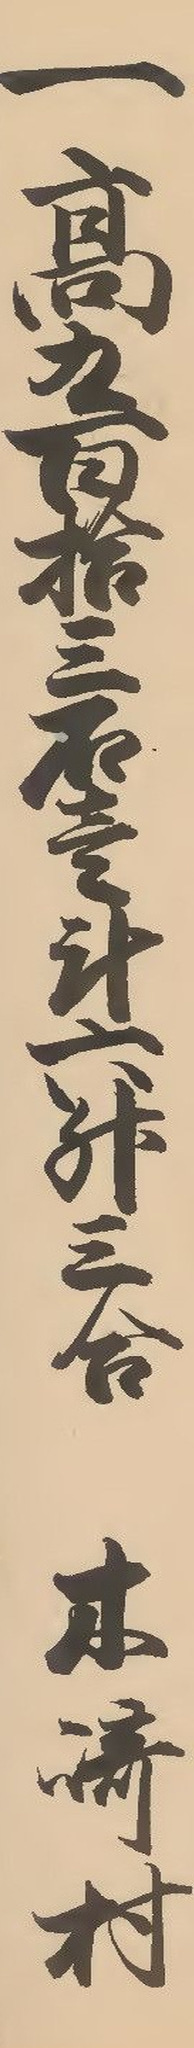一髙九百拾三石壱斗六升三合木崎村
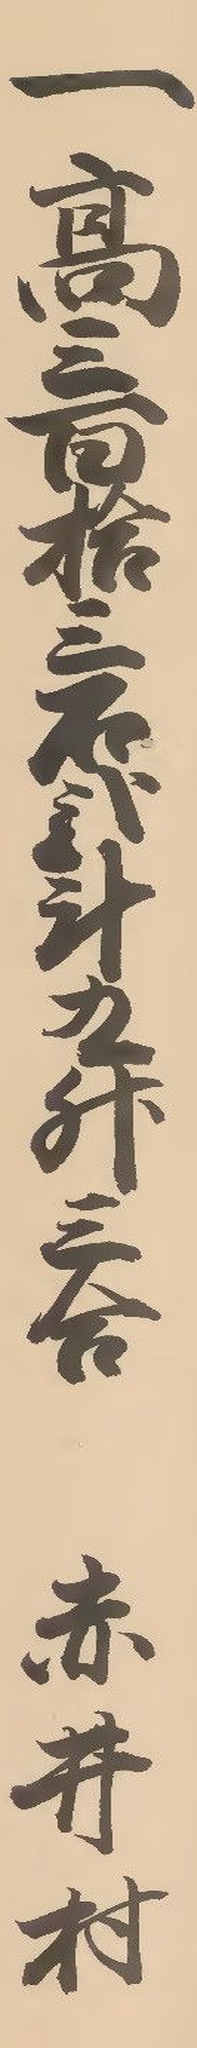一髙三百拾三石弐斗九升三合赤井村
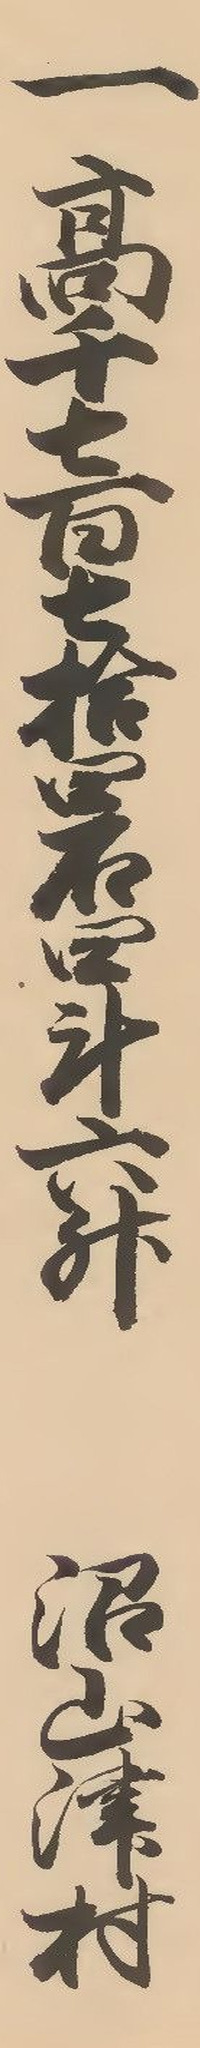一髙千七百七拾四石四斗六升沼山津村
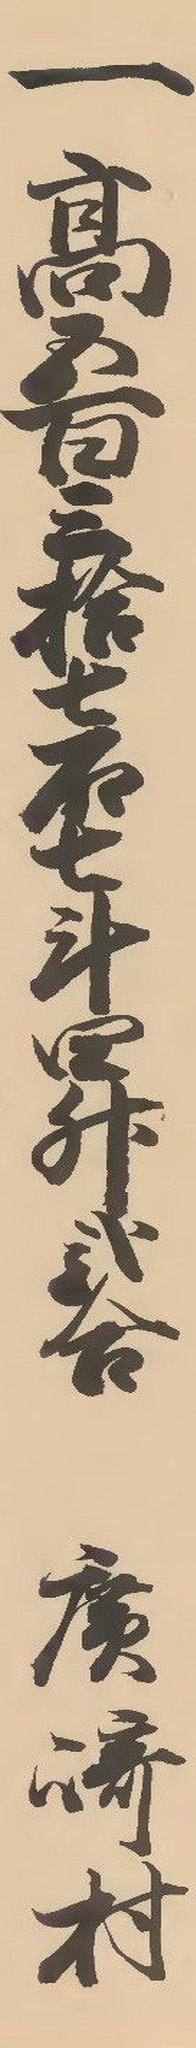一髙五百三拾七石七斗四升弐合廣崎村
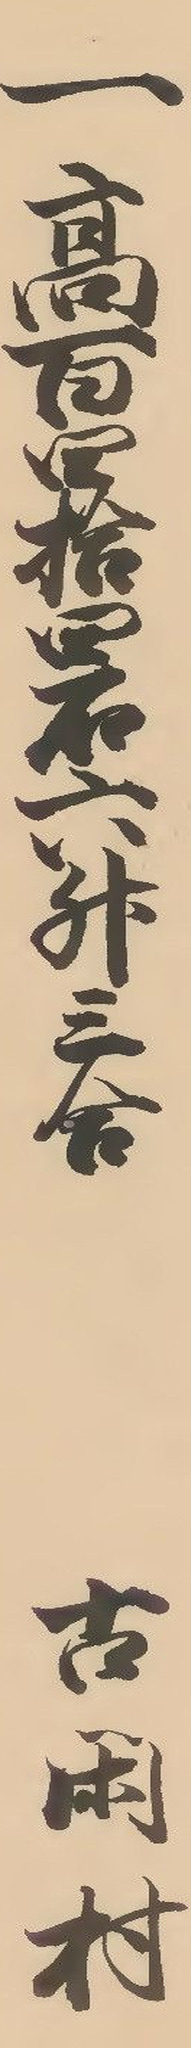一髙百四拾四石六升三合古閑村
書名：肥後国郷帳
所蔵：国立公文書館 National Archives of Japan
